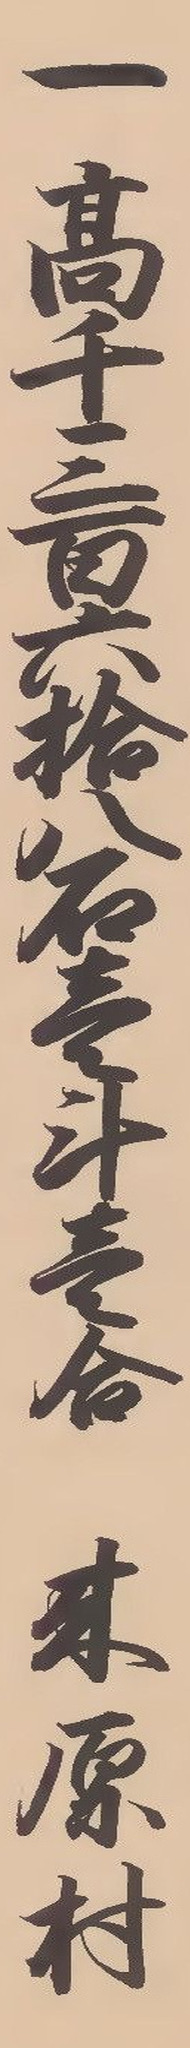一髙千三百六拾八石壱斗壱合來原村
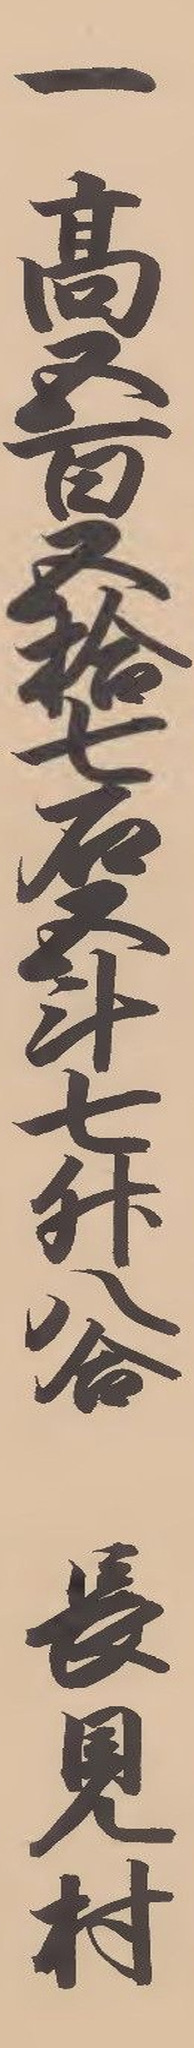一髙五百五拾七石五斗七升八合長見村
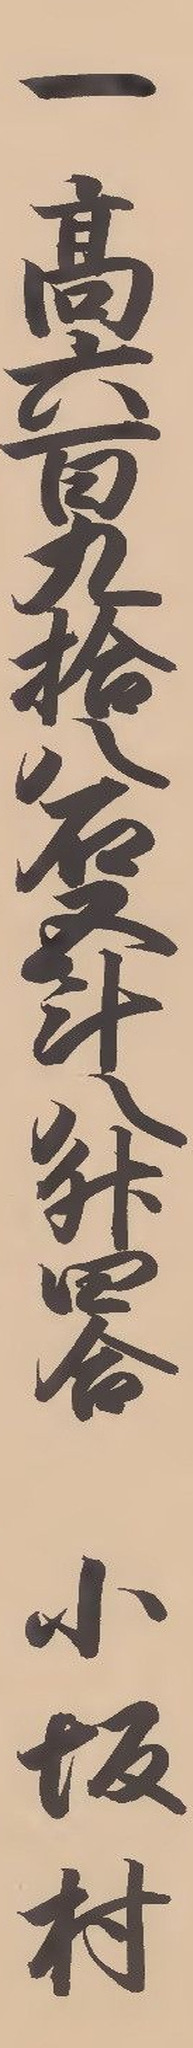一髙六百九拾八石五斗八升四合小坂村
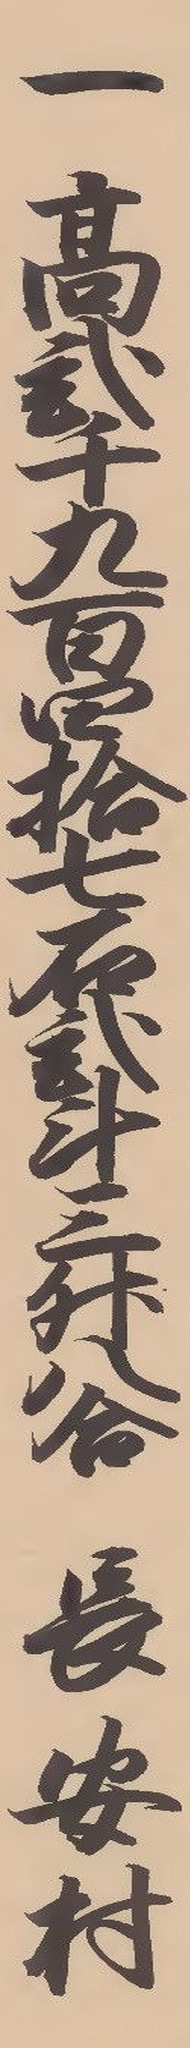一髙弐千九百四拾七石弐斗三升八合長安村
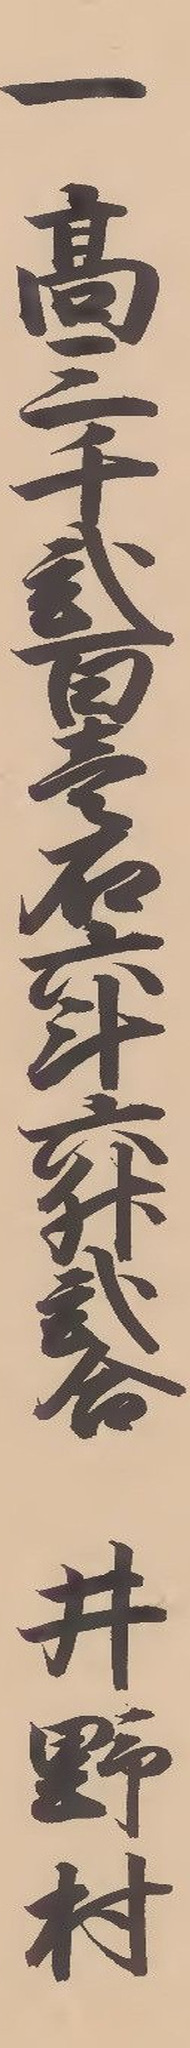一髙三千弐百壱石六斗六升弐合井野村

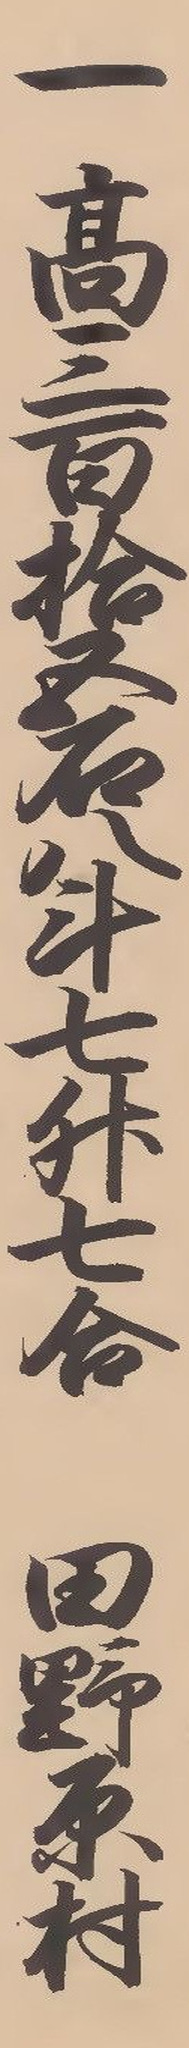一髙三百拾五石八斗七升七合田野原村
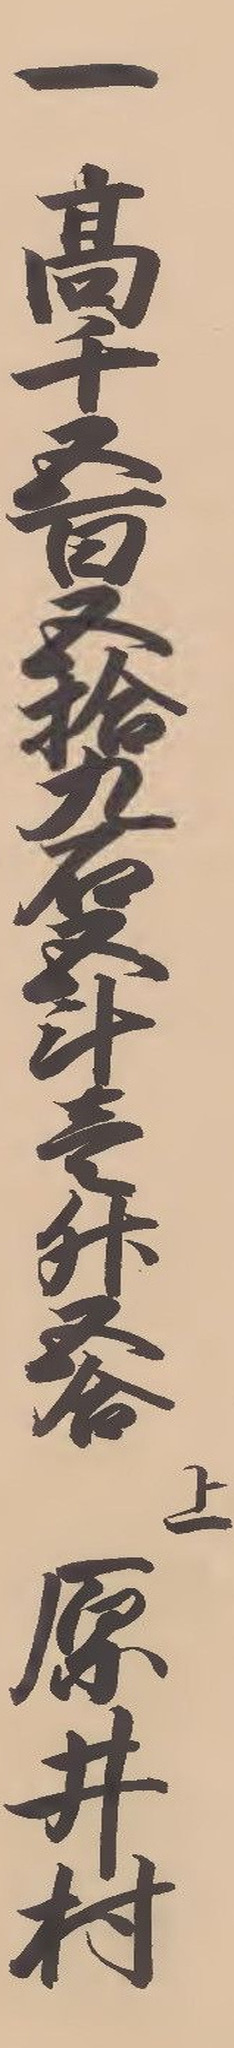一髙千五百五拾九石五斗壱升五合原井村
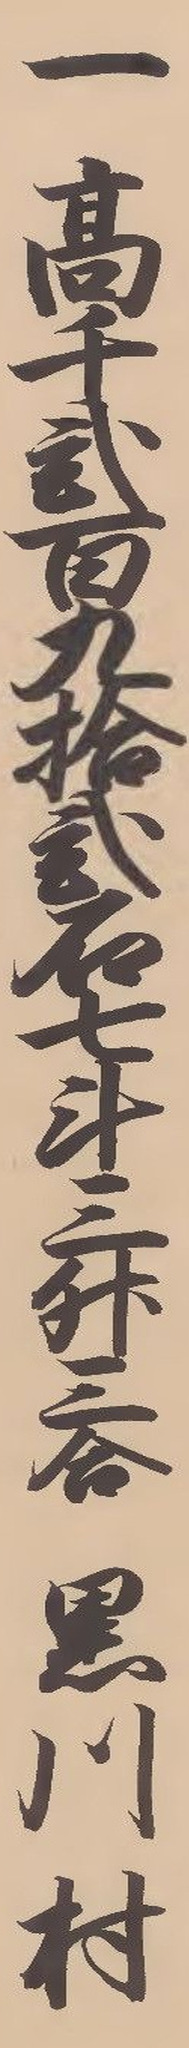一髙千弐百九拾弐石七斗三升三合黑川村
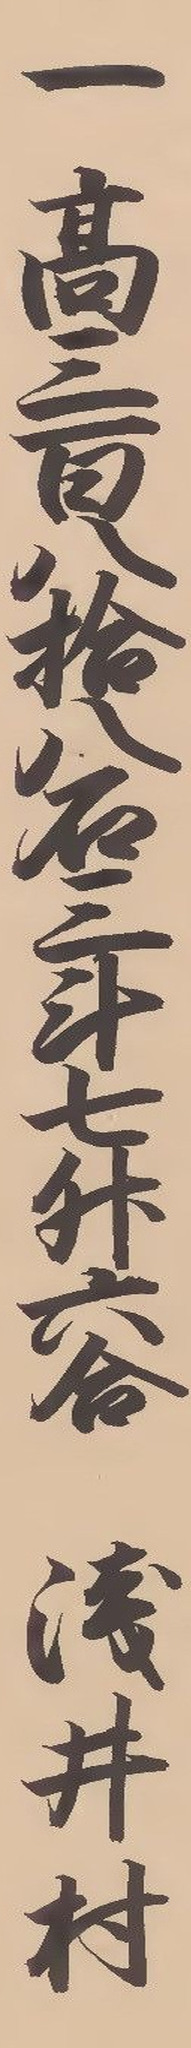一髙三百八拾八石三斗七升六合浅井村
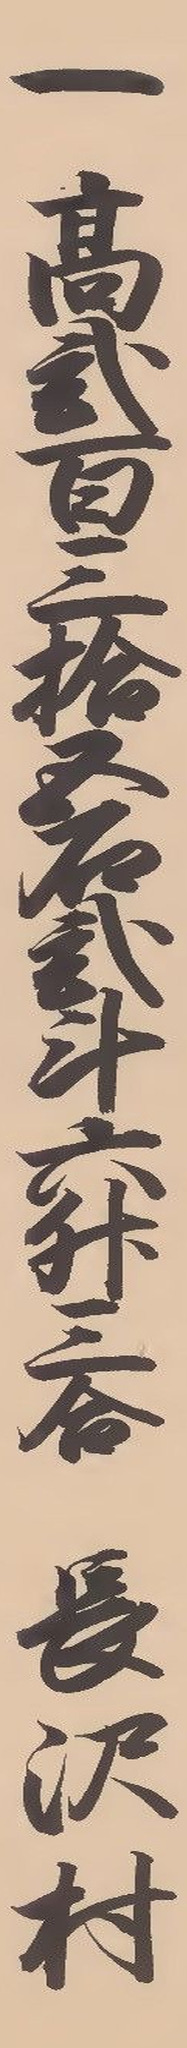一髙弐百三拾五石弐斗六升三合長沢村
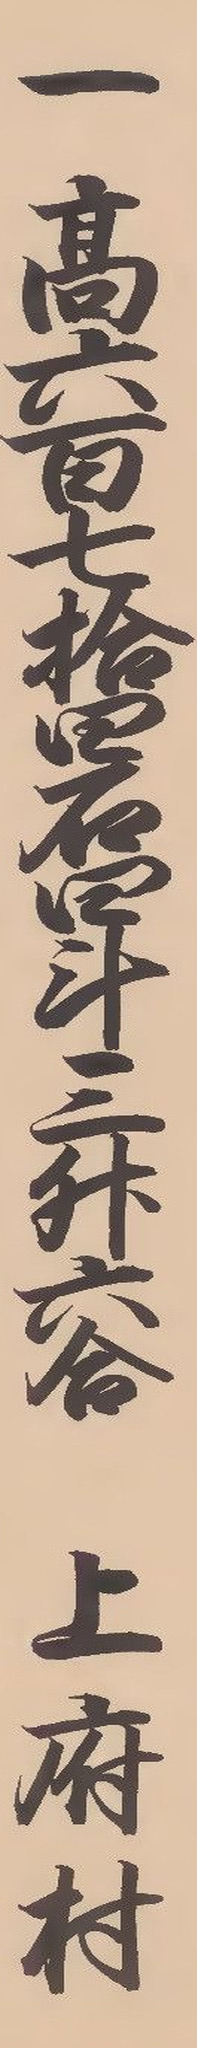一髙六百七拾四石四斗三升六合上府村
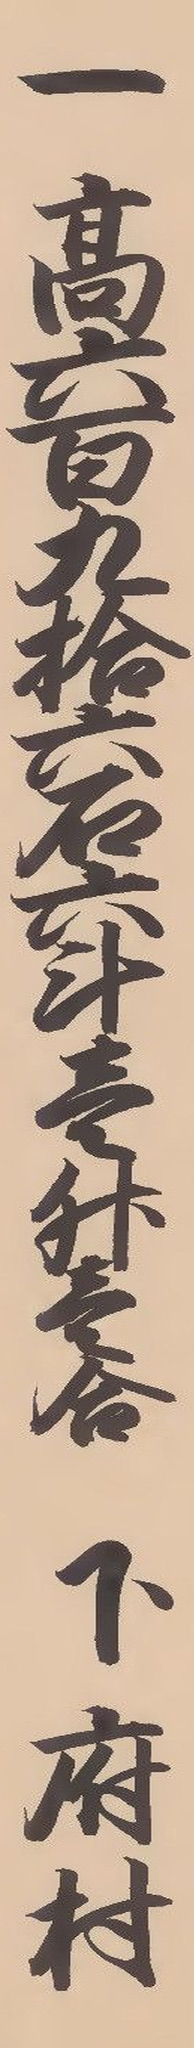一髙六百九拾六石六斗壱升壱合下府村
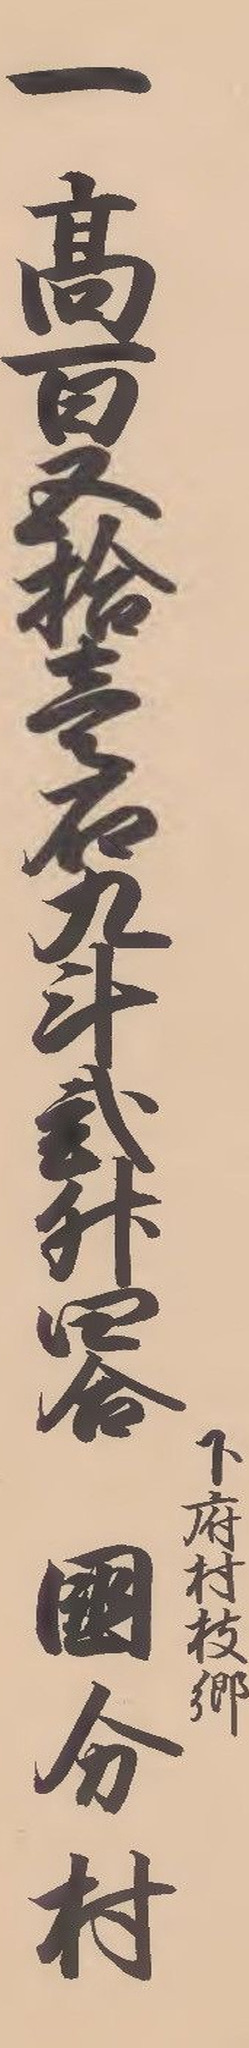一髙百五拾壱石九斗弐升四合國分村

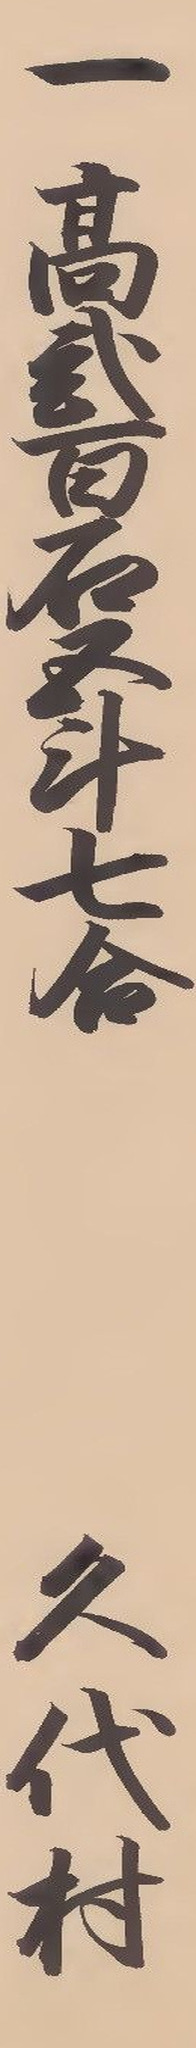一髙弐百石五斗七合久代村
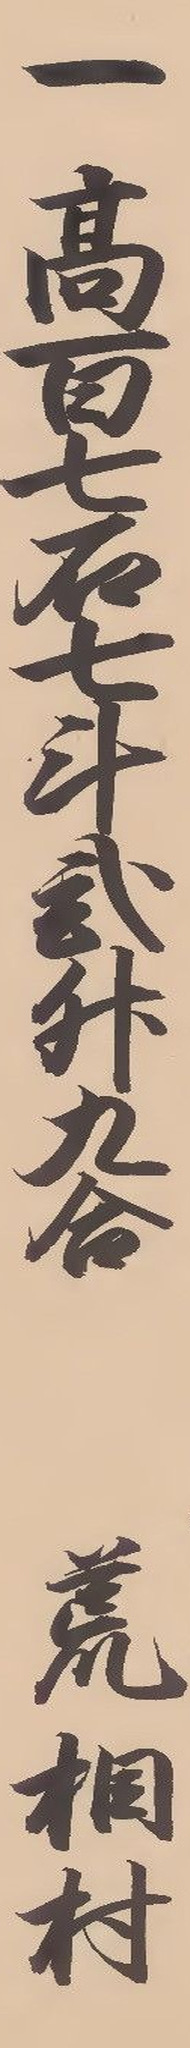一髙百七石七斗弐升九合荒相村
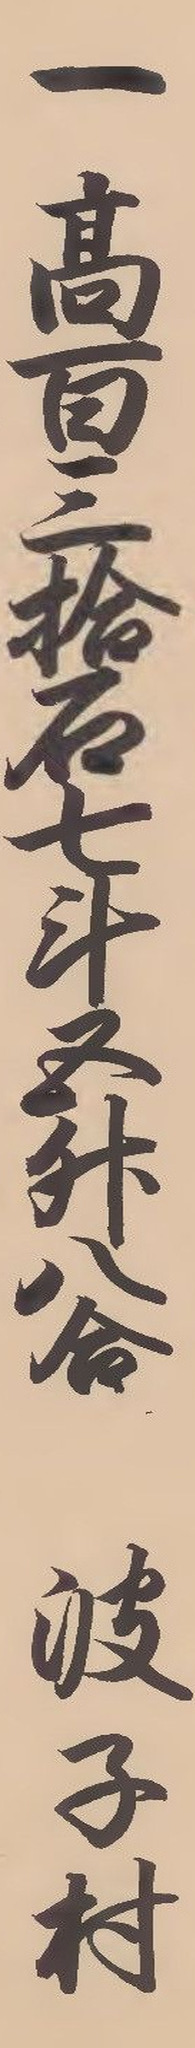一髙百三拾石七斗五升八合波子村
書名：石見国郷帳
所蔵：国立公文書館 National Archives of Japan
